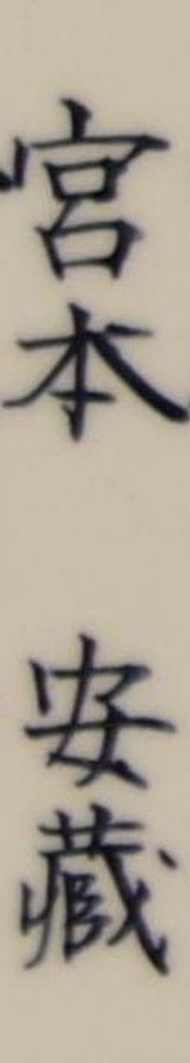宮本安蔵
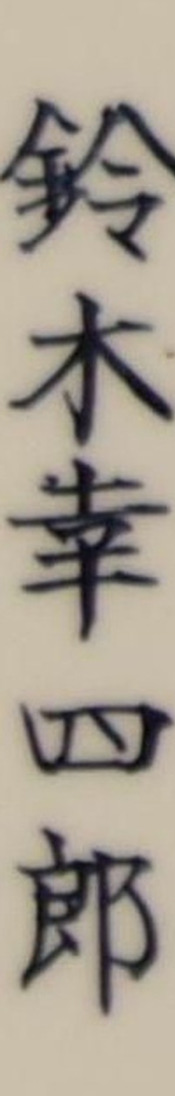鈴木幸四郎
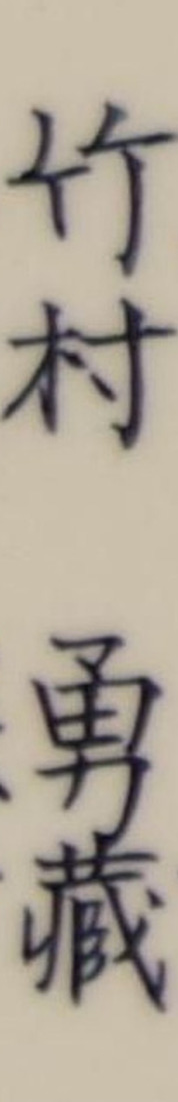竹村勇蔵
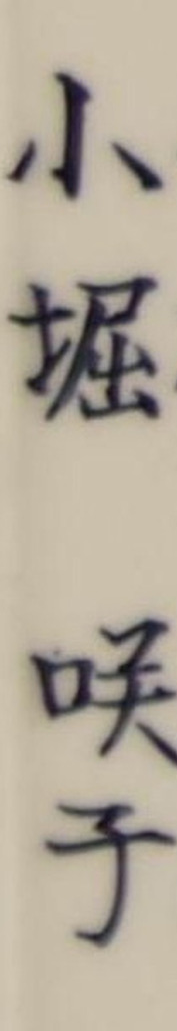小堀咲子

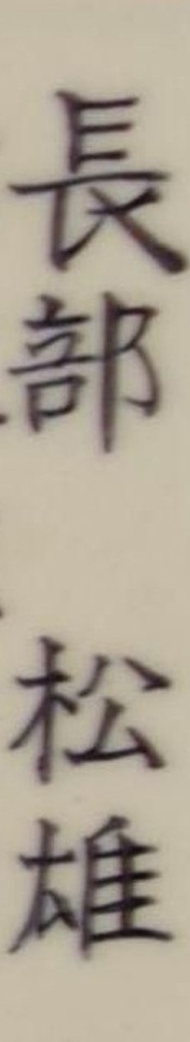長部:松雄
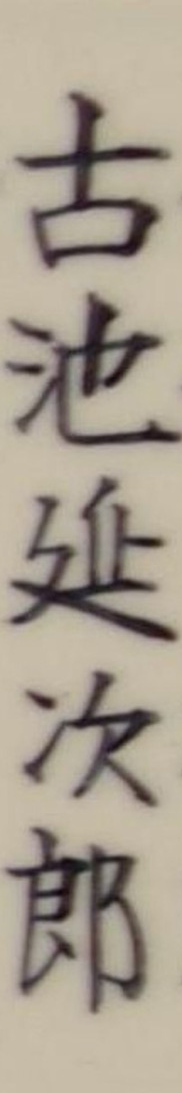古池延次郎
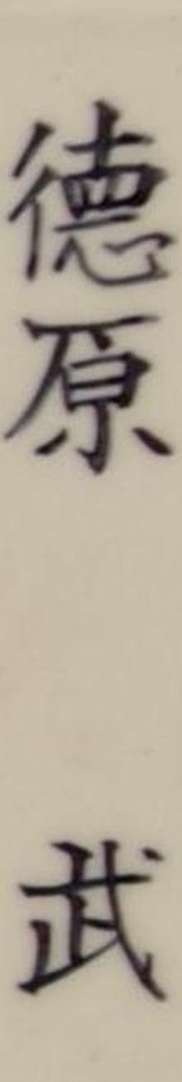徳原武
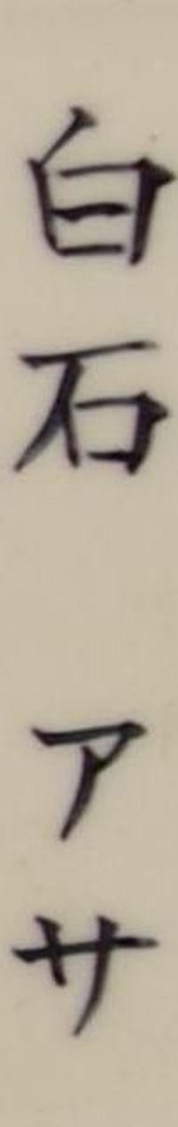白石アサ
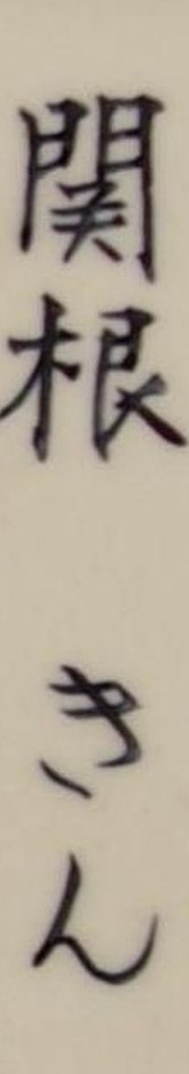関根きん
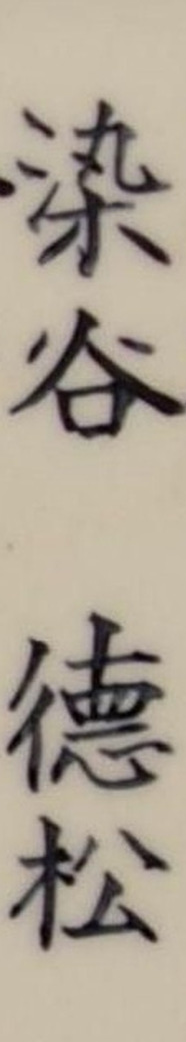染谷徳松
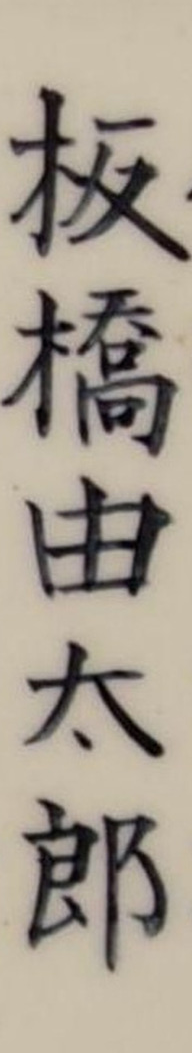板橋由太郎
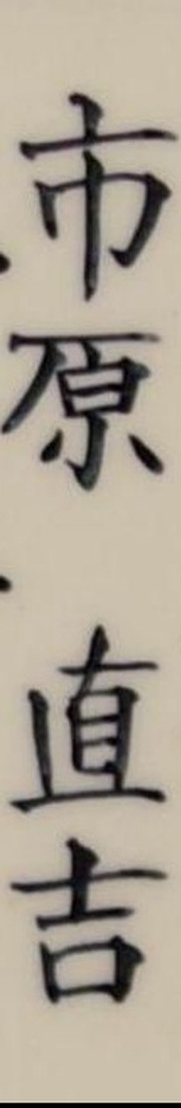市原直吉
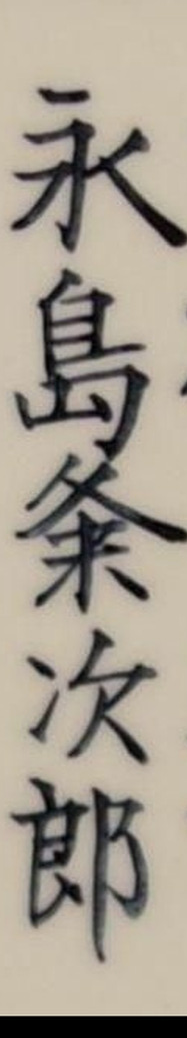永島粂次郎
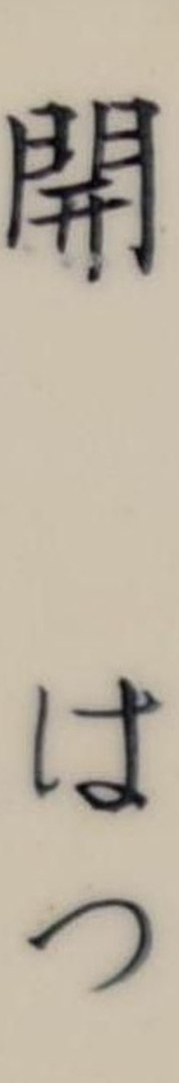開はつ
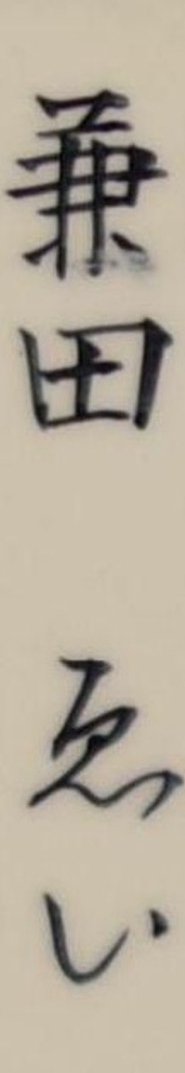兼田ゑい
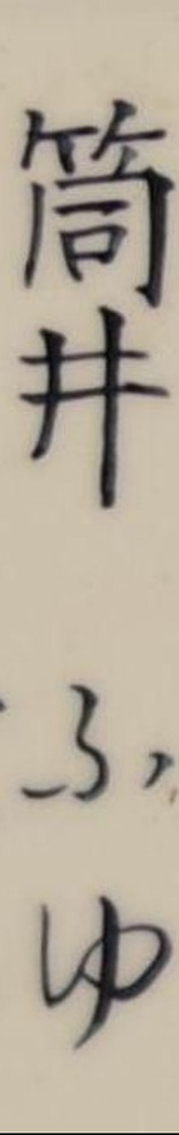筒井ふゆ
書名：M~S
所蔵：高野山金剛峯寺
